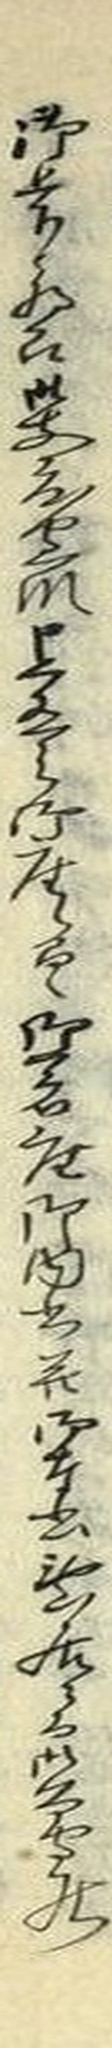御上下被為召御支度宜段申上有之御座之間へ御着座御内書幷御奉書台居ニ而御留守居
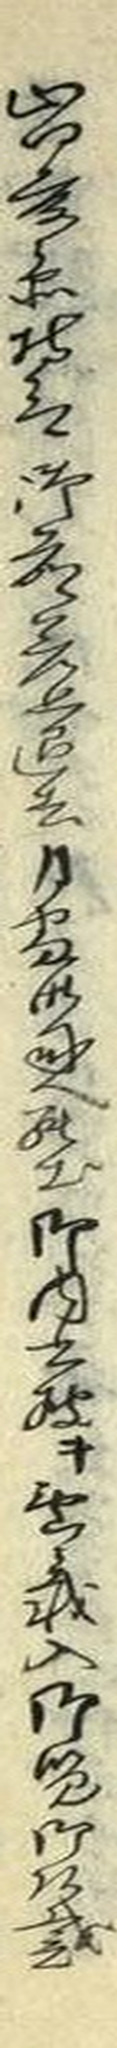山田藤兵衛持参御前へ差上退去月番御用人罷出御内書披キ台ニ載入御覧御頂戴
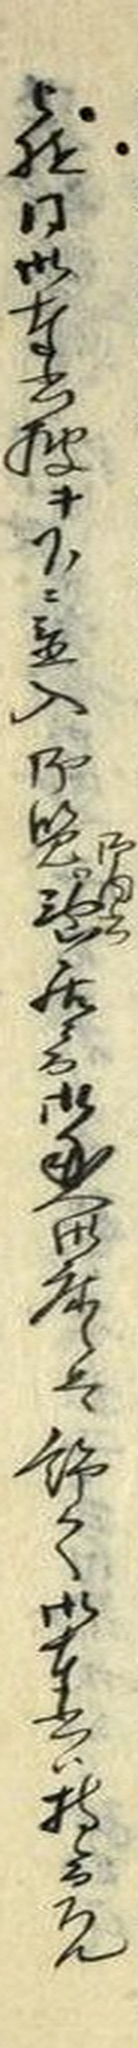被遊同御奉書披キ下ニ置入御覧御内書台居ニ而御用人御床之上へ飾之御奉書ハ持候而下ル

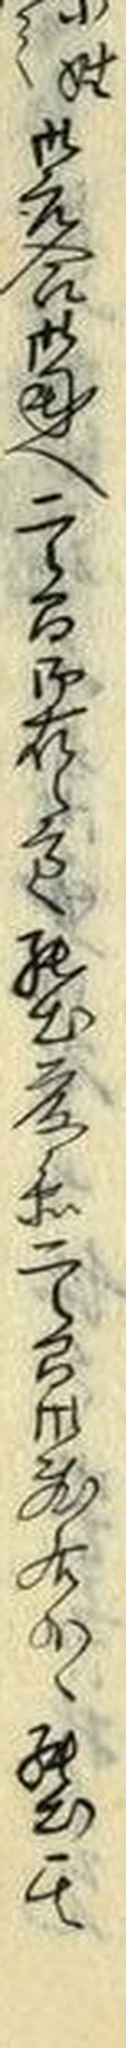役之御取合御用人二之間御左之方へ罷出藤兵衛二之間御敷居外へ罷出其
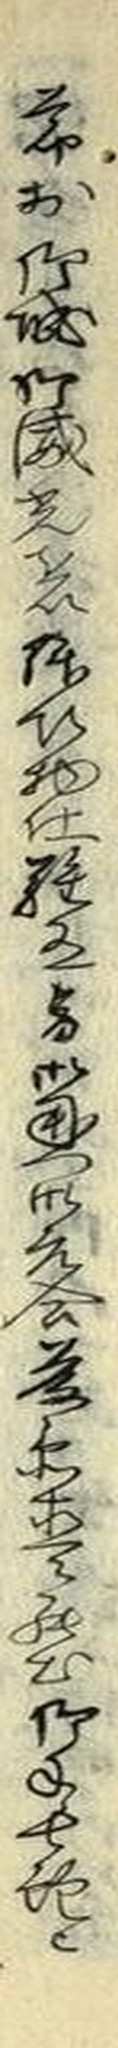節於御城御威光を以拝領物仕難有旨御用人御取合藤兵衛直ニ罷出御手長鮑被
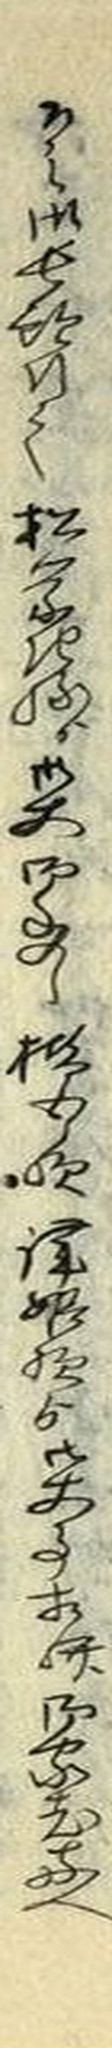下之御長鮑引之松栄院様ゟ御使御手のし楷五郎様謹姫様ゟ御使事相済御家老両人
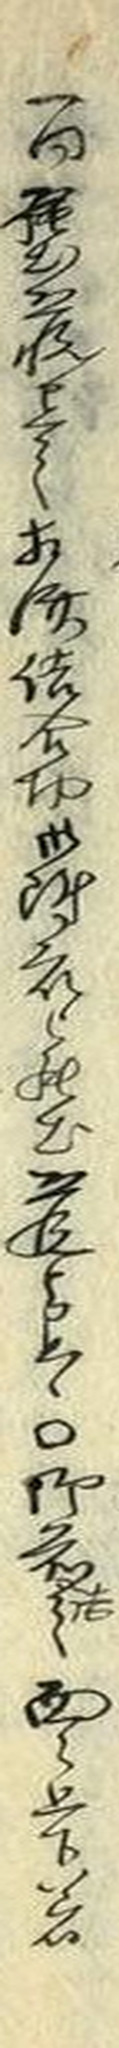一同罷出恐悦申上之相済詰合切御附衆被罷出恐悦被申上候〇御前詰之面々上下着
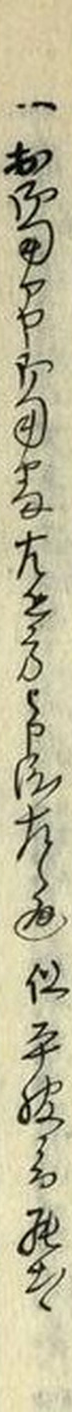一於御用部屋御用番左近方被申渡左之通但平服ニ而罷出候
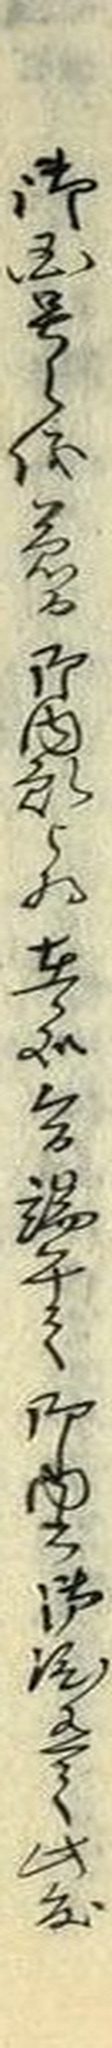御国号之儀兼而御内願被為在候処今日端午之御内書御渡有之此度
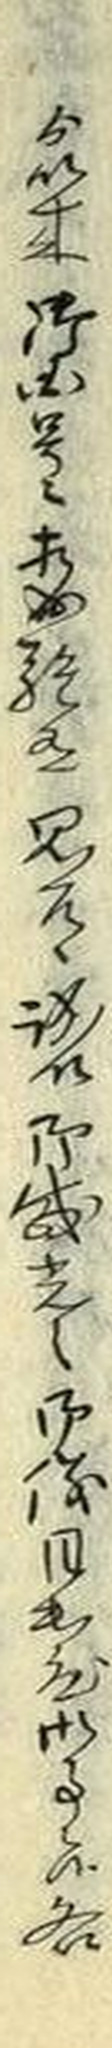ゟ以来御国号ニ相成難有思召候誠以御威光之御儀目出度御事ニ候各
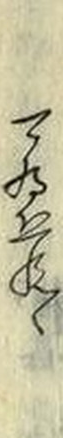可為恐悦候
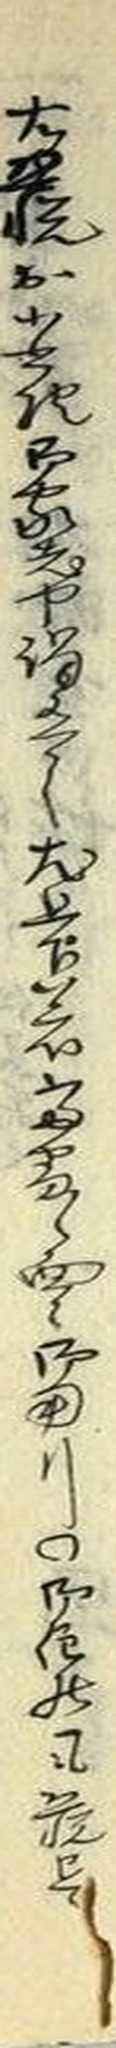右恐悦於小書院御家老中謁有之尤上下着当番之面々御用引〇御住居へも恐悦申上候
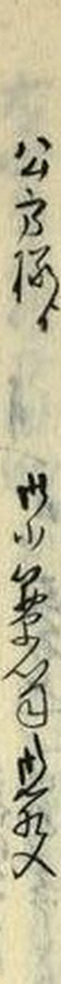公方様ゟ御小箪笥御箱入
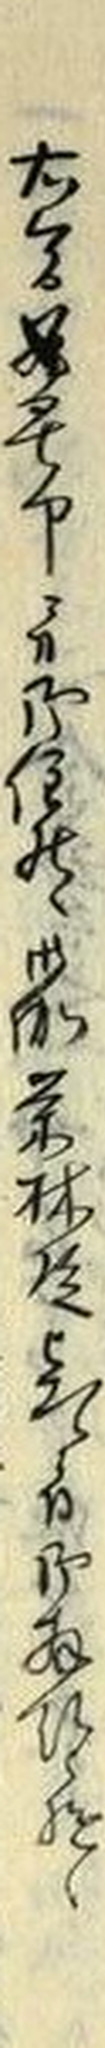右今日暑中ニ付御住居へ御伽栄林殿被出候ニ付御拝領被遊候
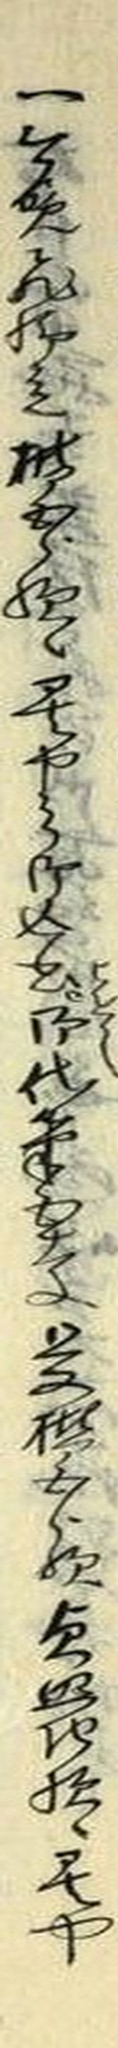一今晩飛脚立楷五郎様へ暑中之御返書被進之御代筆五太夫且又楷五郎様貞照院様へ暑中
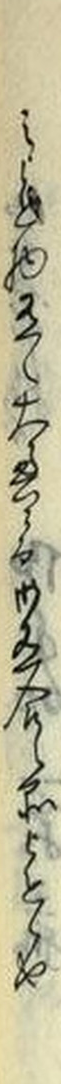之被進物有之大奥ニ而御有合之品被進候由
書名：少傅日録抄（斉善付側向頭取日記、在府）
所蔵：福井県文書館 Fukui Prefectural Archives
